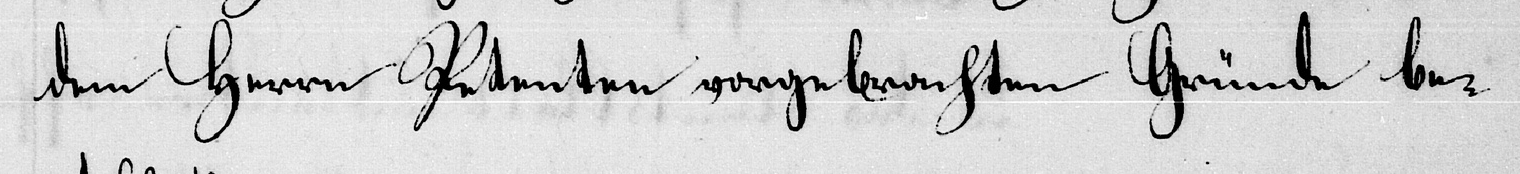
dem Herrn Petenten vorgebrachten Gründe be¬
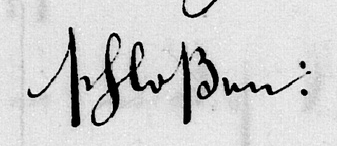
schloßen:
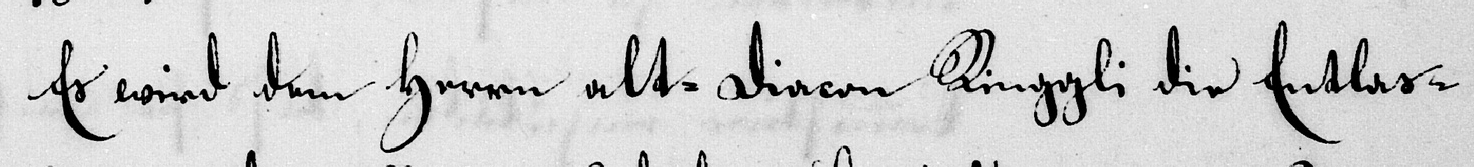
Es wird dem Herrn alt-Diacon Ringgli die Entlas¬
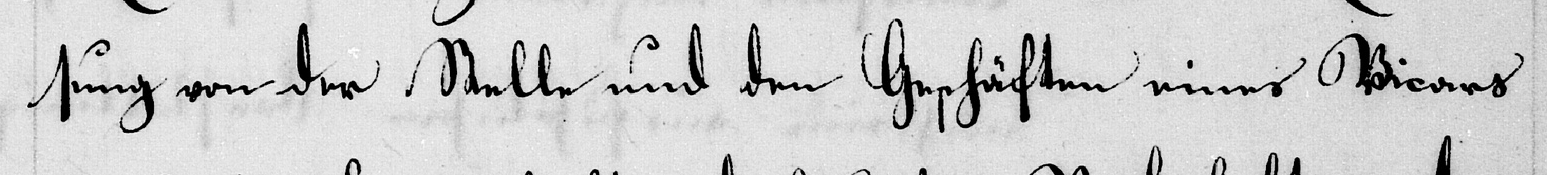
sung von der Stelle und den Geschäften eines Vicars
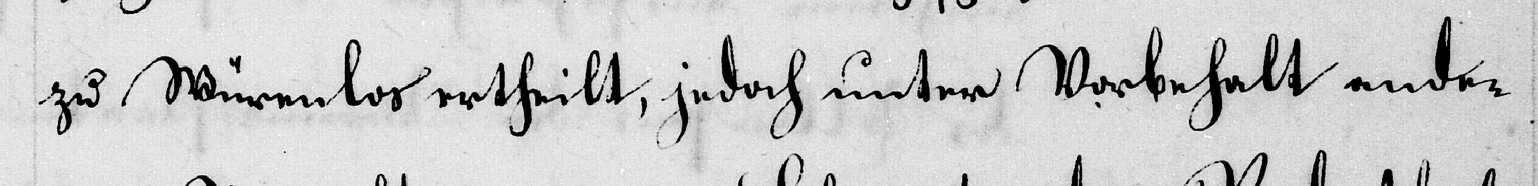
zu Würenlos ertheilt, jedoch unter Vorbehalt ande¬
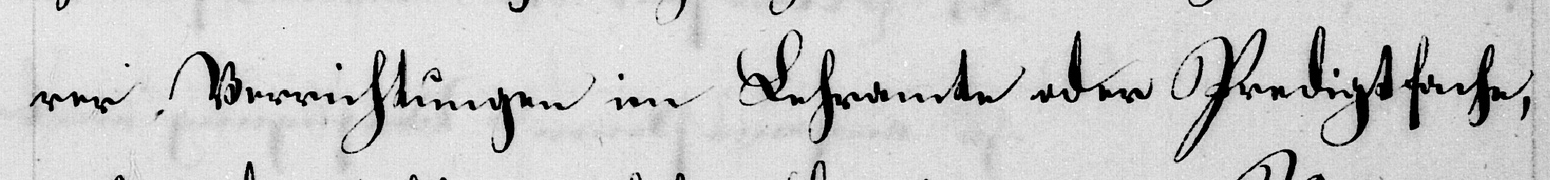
rer Verrichtungen im Lehramte oder Predigtfache,
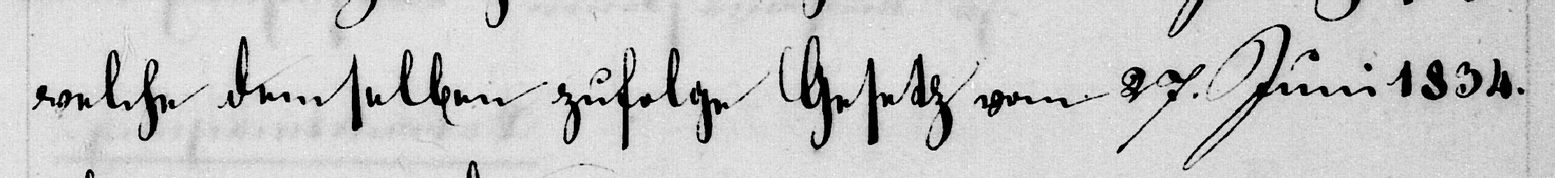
welche demselben zufolge Gesetz vom 27. Juni 1834.
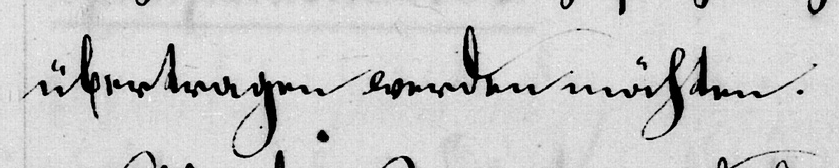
übertragen werden möchten.
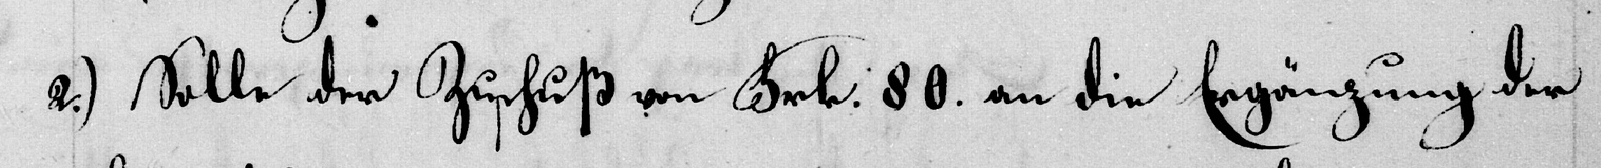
2.) Solle der Zuschuß von Frk. 80. an die Ergänzung der
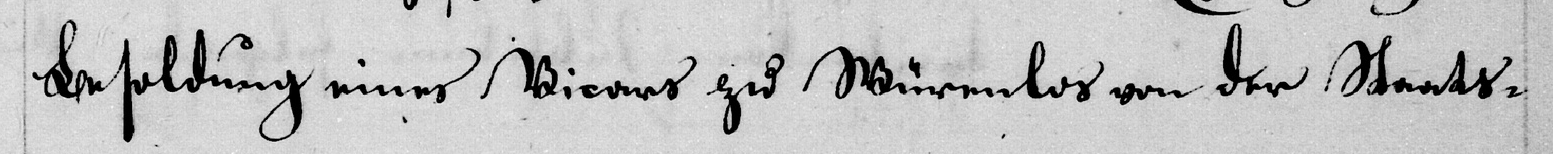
Besoldung eines Vicars zu Würenlos von der Staats-
